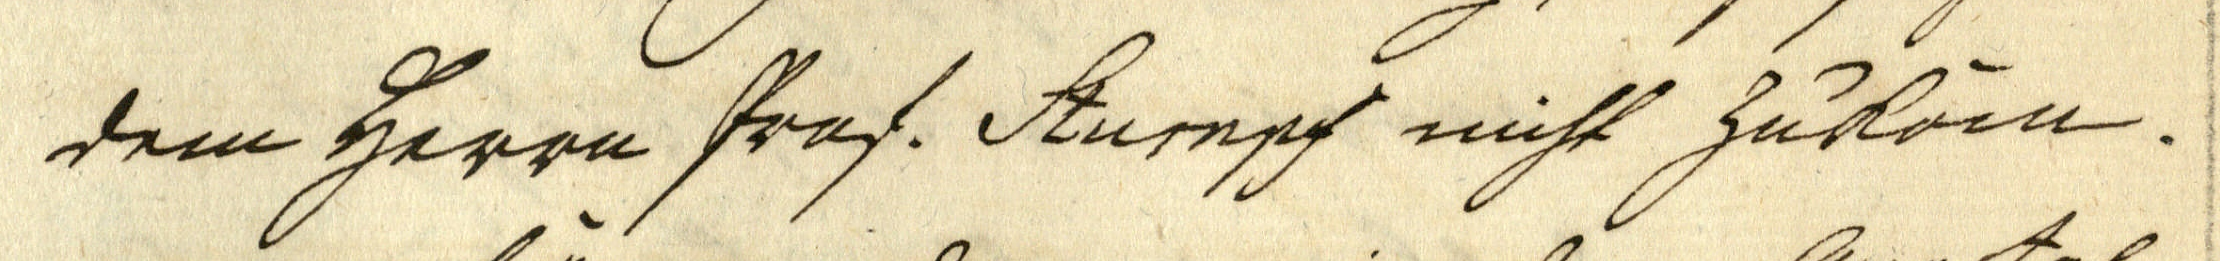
dem Herrn Prof. Stumpf nicht zukom¬
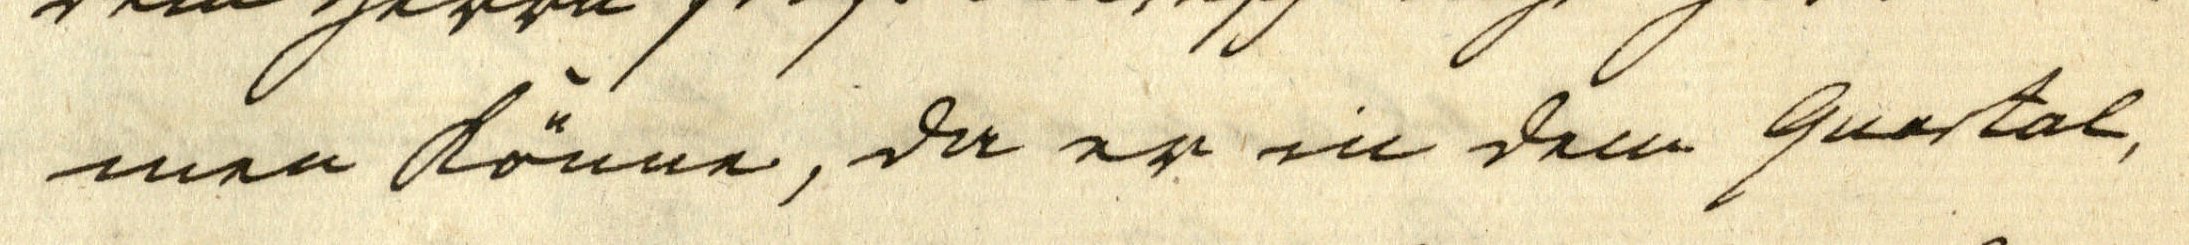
men könne, da er in dem Quartal,
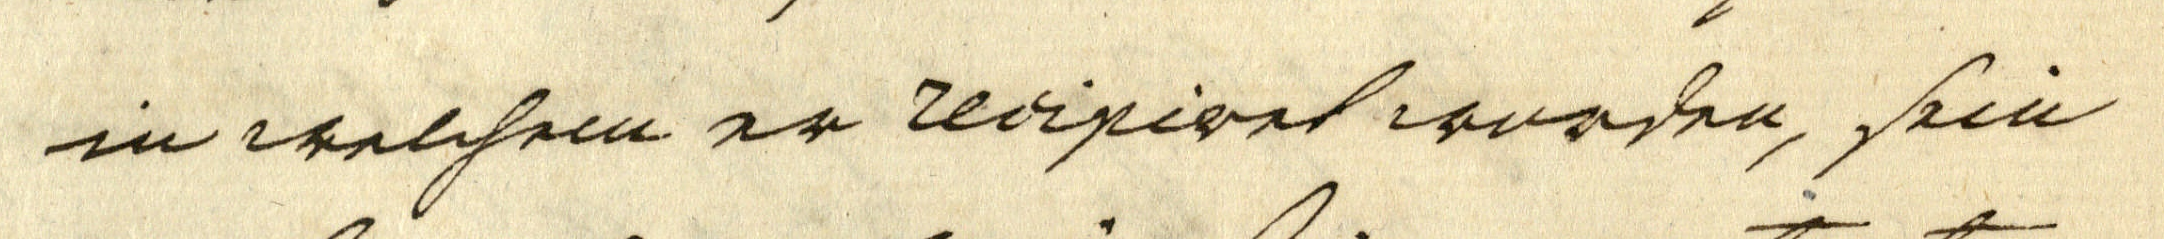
in welchem er recipirt worden, sein
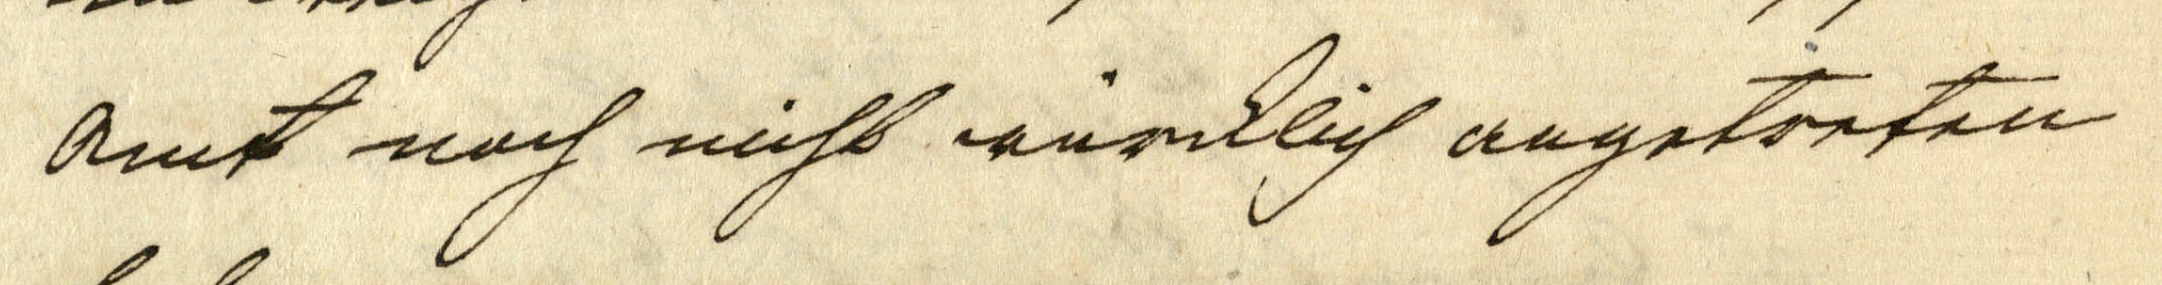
Amt noch nicht würcklich angetreten
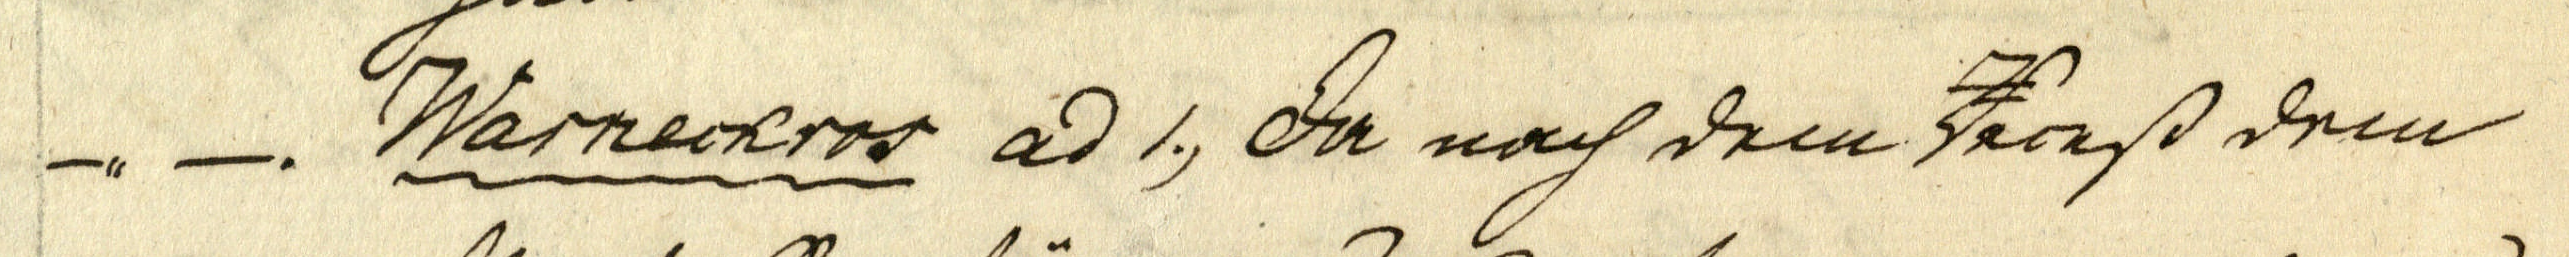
Warneckros ad 1., Da nach dem Receß dem
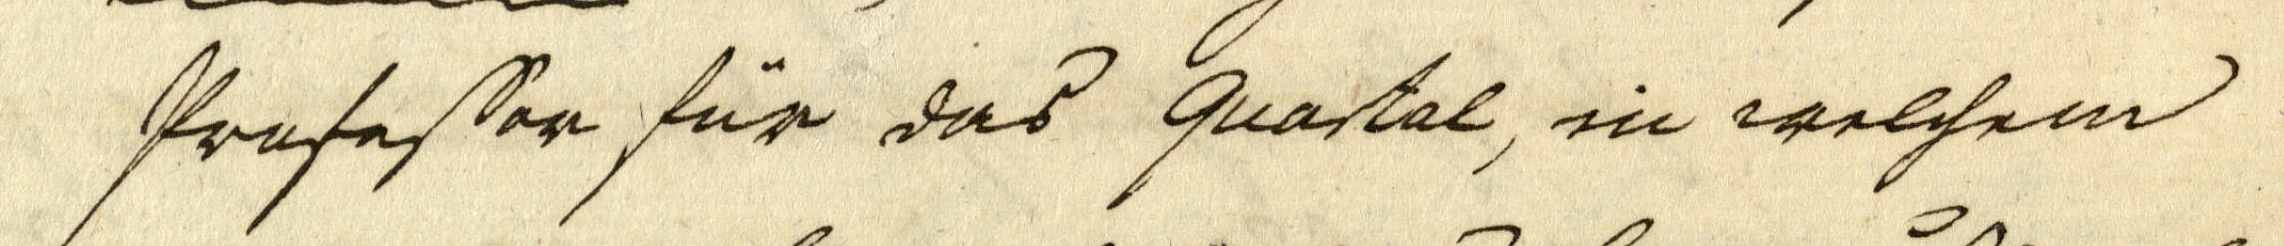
Professor für das Quartal, in welchem
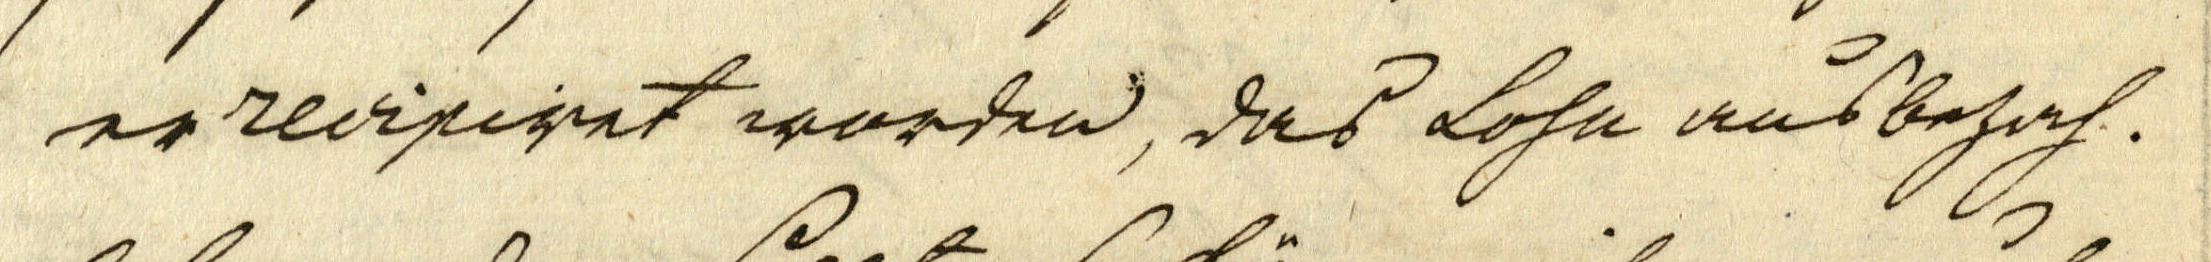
er recipiret worden, das Lohn ausbezah¬
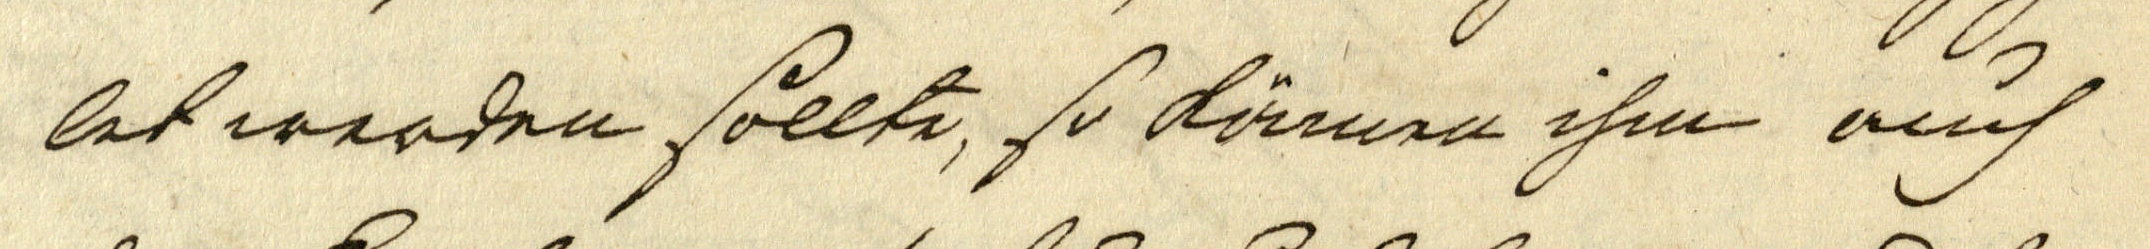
let werden sollte, so kämen ihm auch
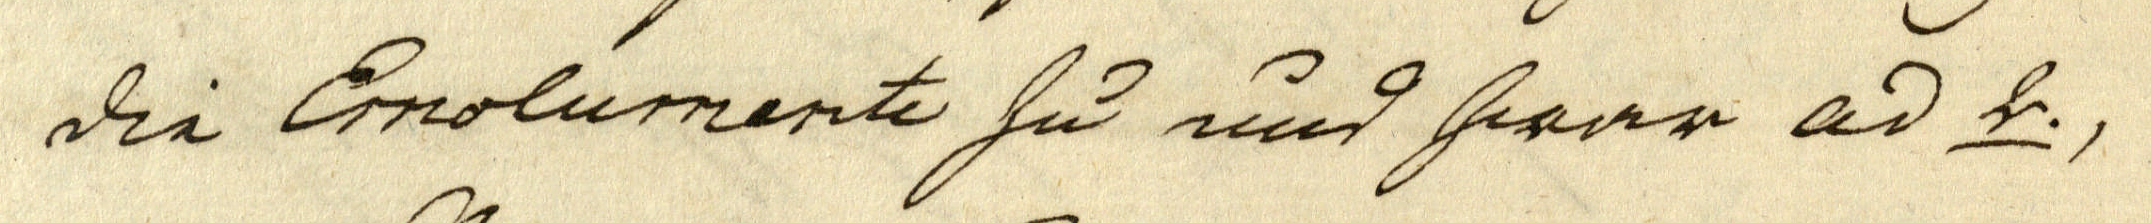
die Emolumente zu und zwar ad 2.,
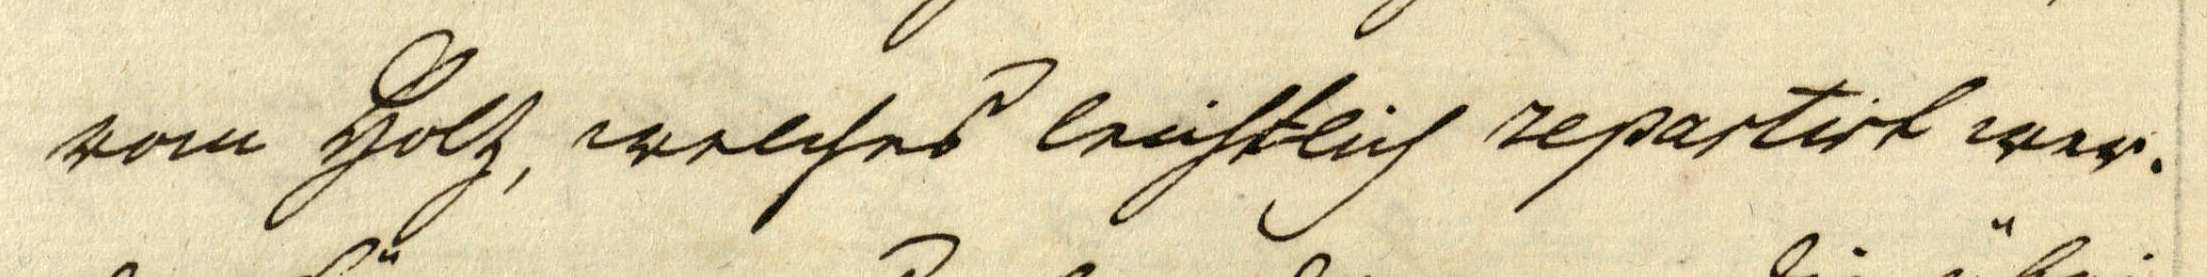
vom Holz, welches leichtlich repartirt wer¬
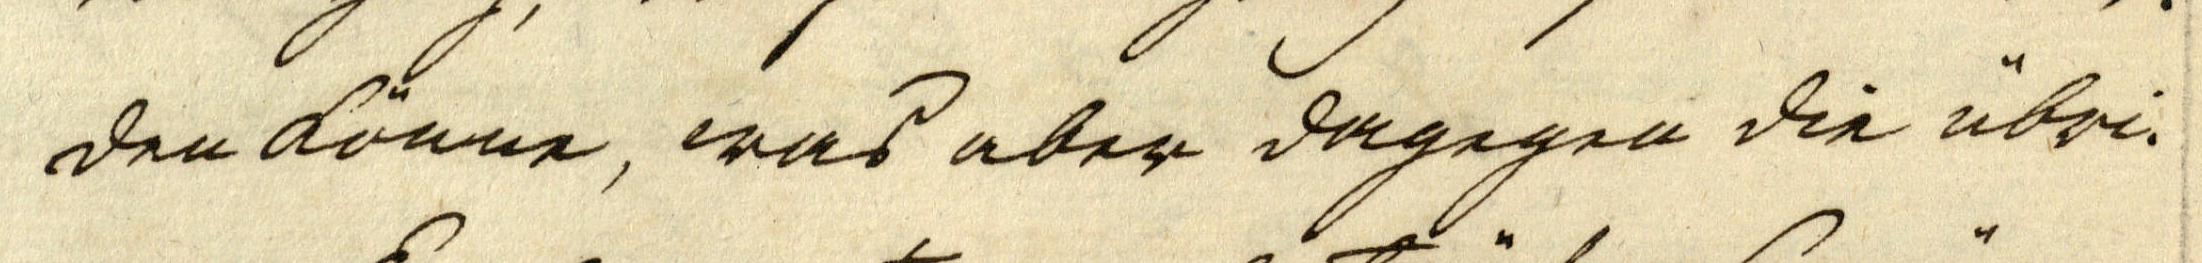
den könne, was aber dagegen die übri¬
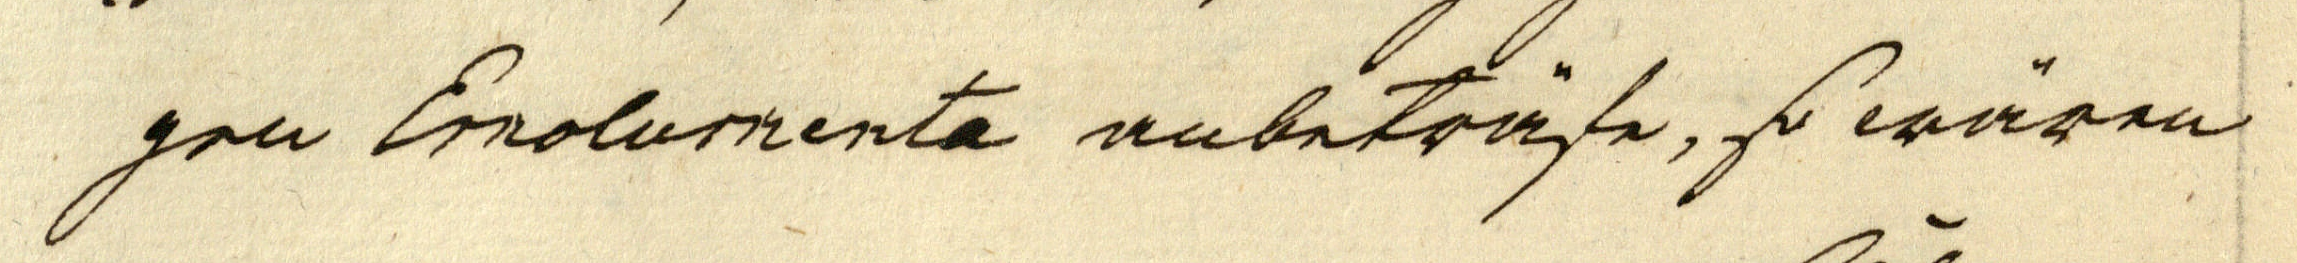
gen Emolumente anbeträfe, so wären
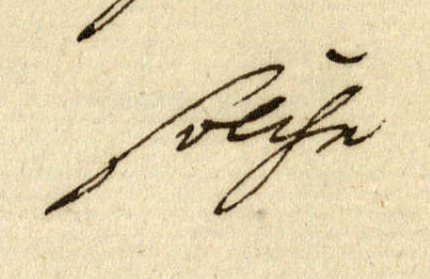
solche
